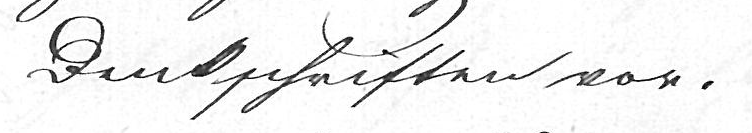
Denkschriften vor.
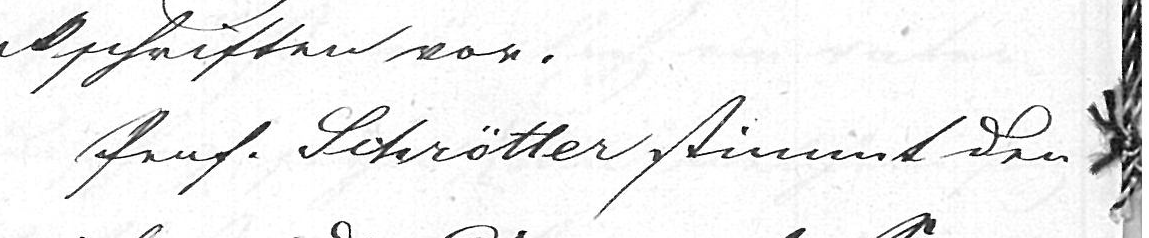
Prof. Schrötter stimmt den
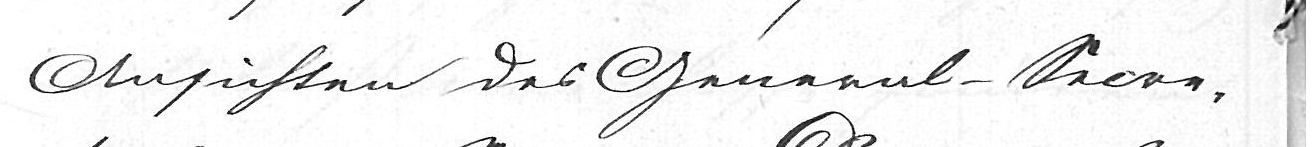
Ansichten des General-Secre-
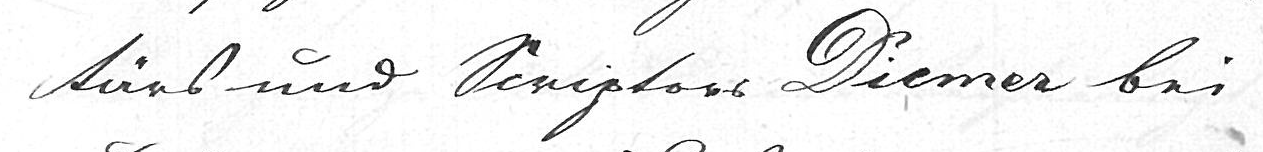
tärs und Scriptors Diemer bei
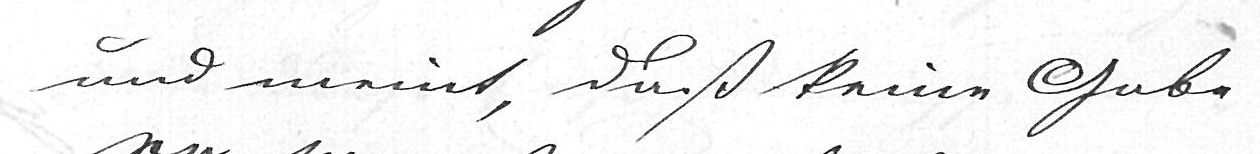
und meint, daß keine Gabe
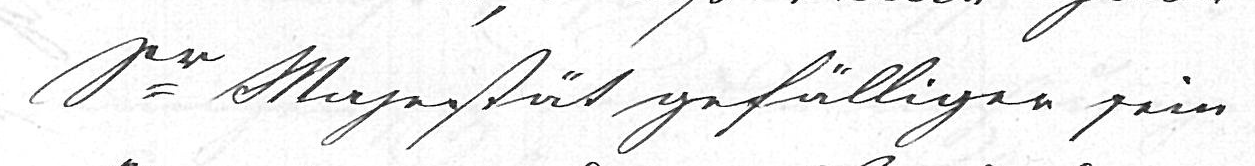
Sr Majestät gefälliger sein
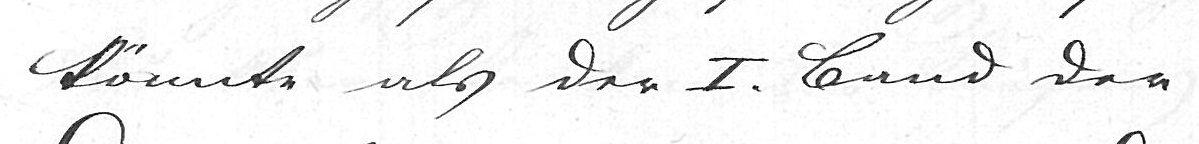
könnte als der I. Bland der
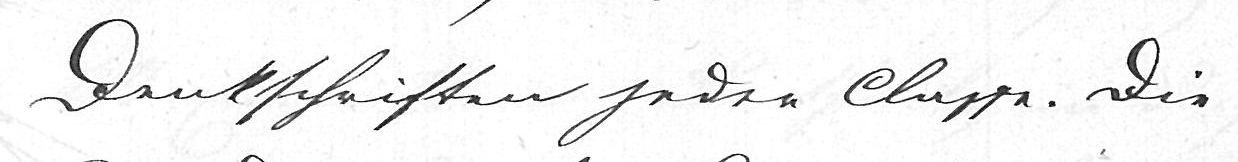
Denkschriften jeder Classe. Die
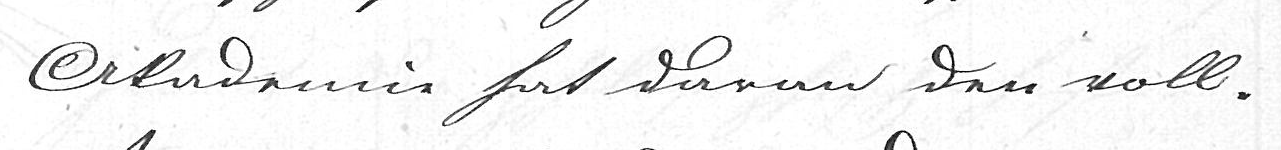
Akademie hat daran den voll-
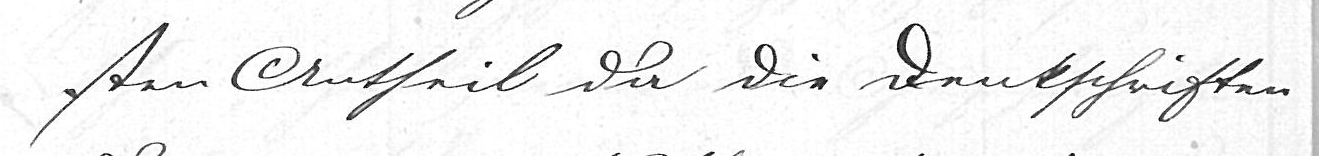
sten Antheil da die Denkschriften
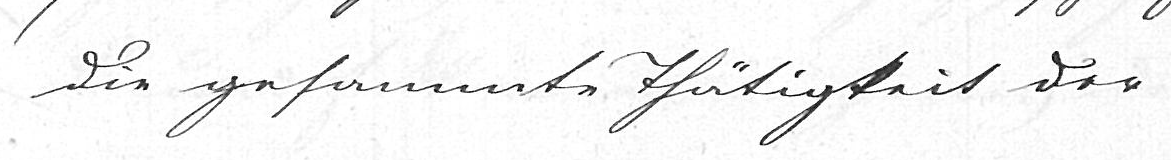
die gesammte Thätigkeit der
